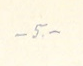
-5.-
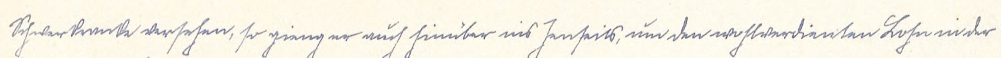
Schwerkrank versehen, so gieng er auch hinüber ins Jenseits, um den wohlverdienten Lohn in der
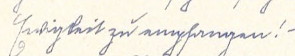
Ewigkeit zu empfangen! -
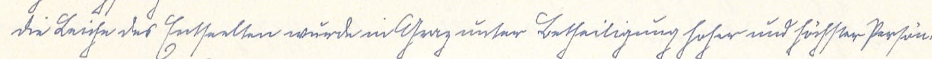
Die Laiche des Entseelten wurde in Graz unter Betheiligung hoher und höchster Person-
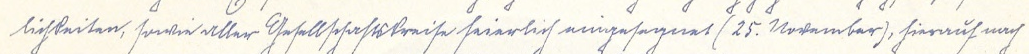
lichkeiten, sowie aller Gesellschaftskreise feierlich eingesegner (25. November), hierauf nach
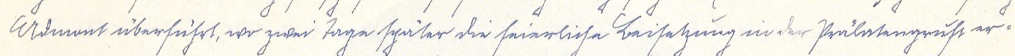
Admont überführt, wo zwei Tage später die feierliche Beisetzung in der Prälatengruft er-
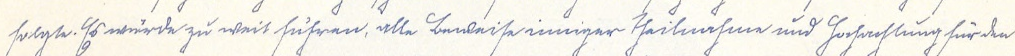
folgte. Es würde zu weit führen, alle Beweise inniger Theilnahme und Hochachtung für den
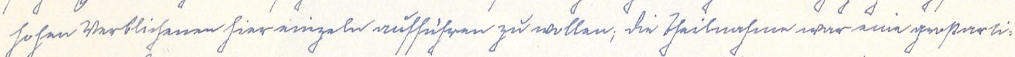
hohen Verblichenen hier einzeln aufführen zu wollen; die Theilnahme war eine großarti-
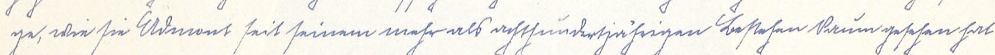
ge, wie sie Admont seit seinem mehr als achthundertjährigen Bestehen kaum gesehen hat
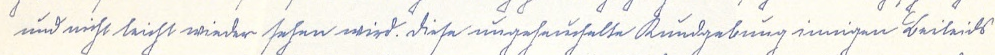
und nicht leicht wieder sehen wird. Diese ungeheuchelte Kundgebung innigen Beileids
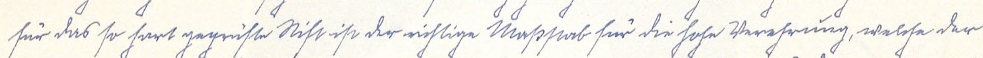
für das so hart geprüfte Stift ist der richtige Maßstab für die hohe Verehrung, welche der
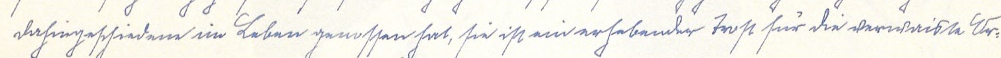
Dahingeschiedenen im Leben genossen hat, sie ist ein erhebender Trost für die verwaiste Or-
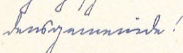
densgemeinde!
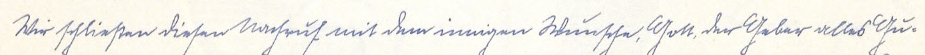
Wir schließen diesen Nachruf mit dem innigen Wunsche, Gott, der Geber alles Gu-
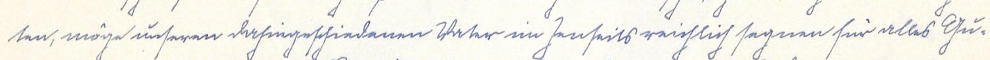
ten, möge unseren dahingeschiedenen Vater im Jenseits reichlich segnen für alles Gu-
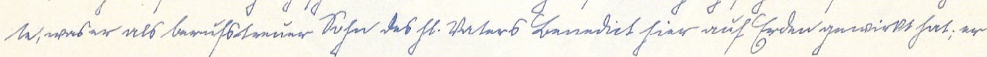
te, was er als berufstreuer Sohn des hl. Vaters Benedict hier auf Erden gewirkt hat; er
